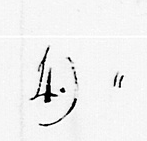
4.)
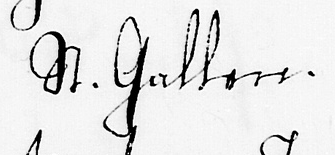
St. Gallen.
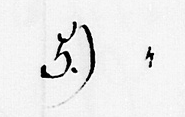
5.)
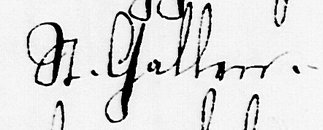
St. Gallen.
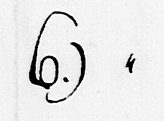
6.)
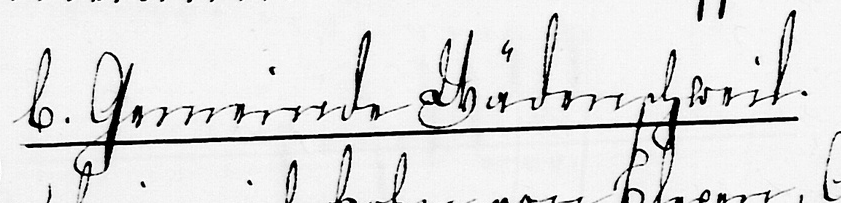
b. Gemeinde Wädenschweil.
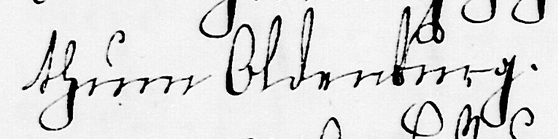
thum Oldenburg.
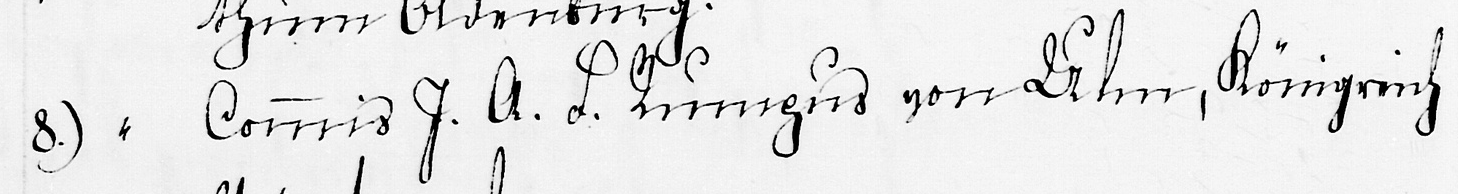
8.) “ Commis J. A. F. Rumpus von Ulm, Königreich
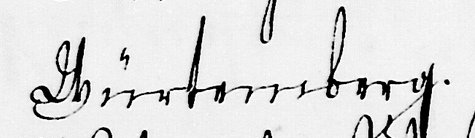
Würtemberg.
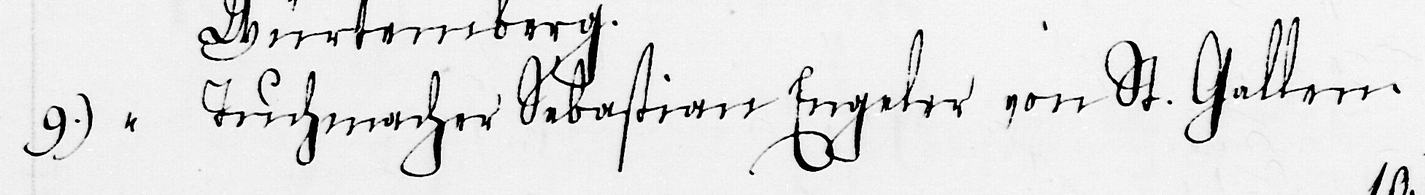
9.) “ Tuchmacher Sebastian Engeler von St. Gallen.
